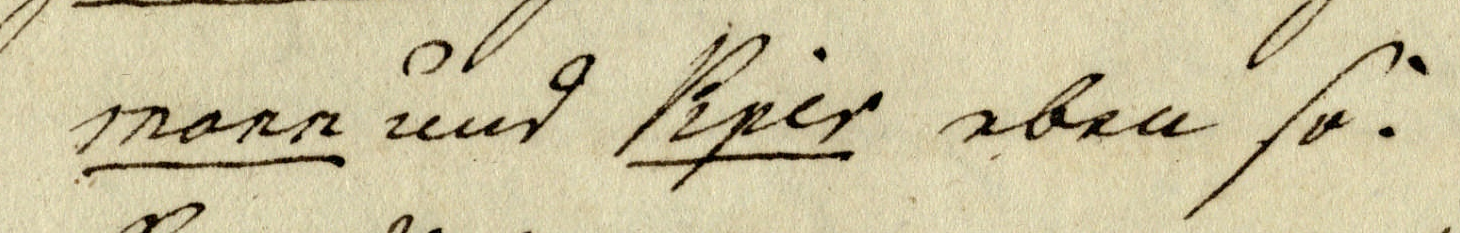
mann und Piper eben so.
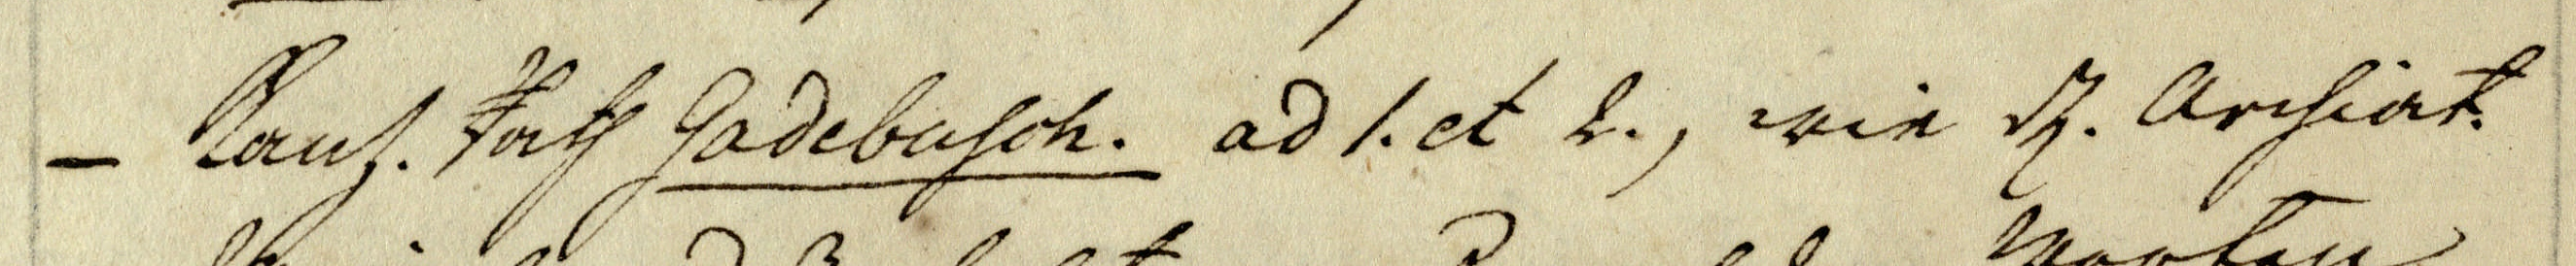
Kanz. Rath Gadebusch. ad 1. et 2., wie dh. Archiat.
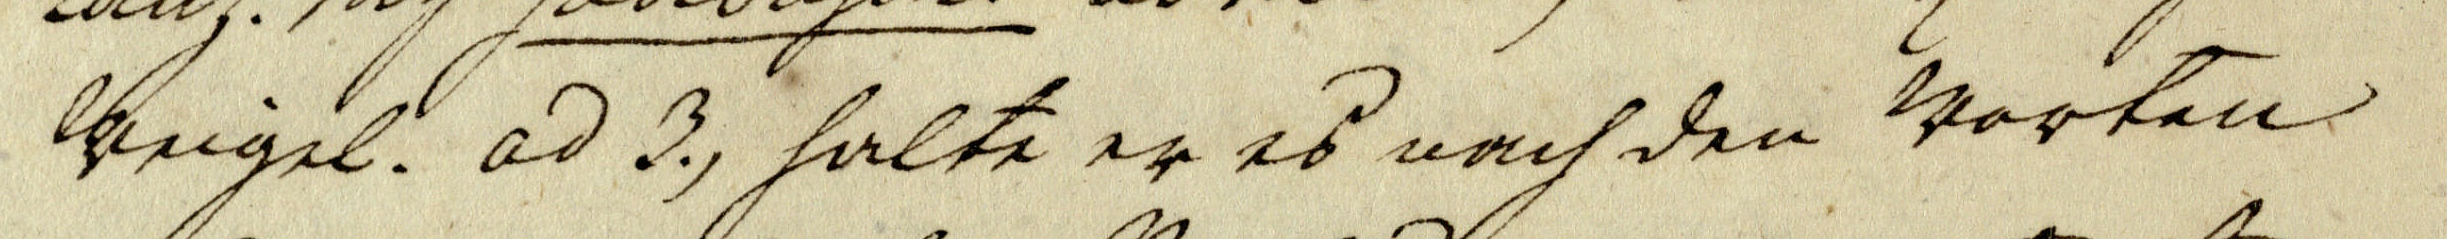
Weigel. ad 3., halte er es nach den Worten
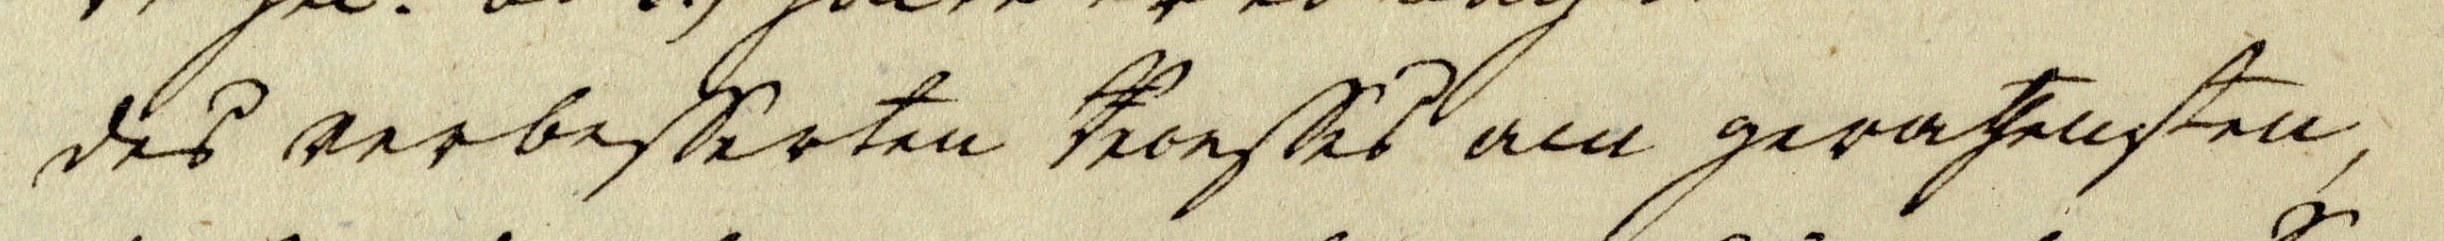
des verbesserten Recesses am gerathensten
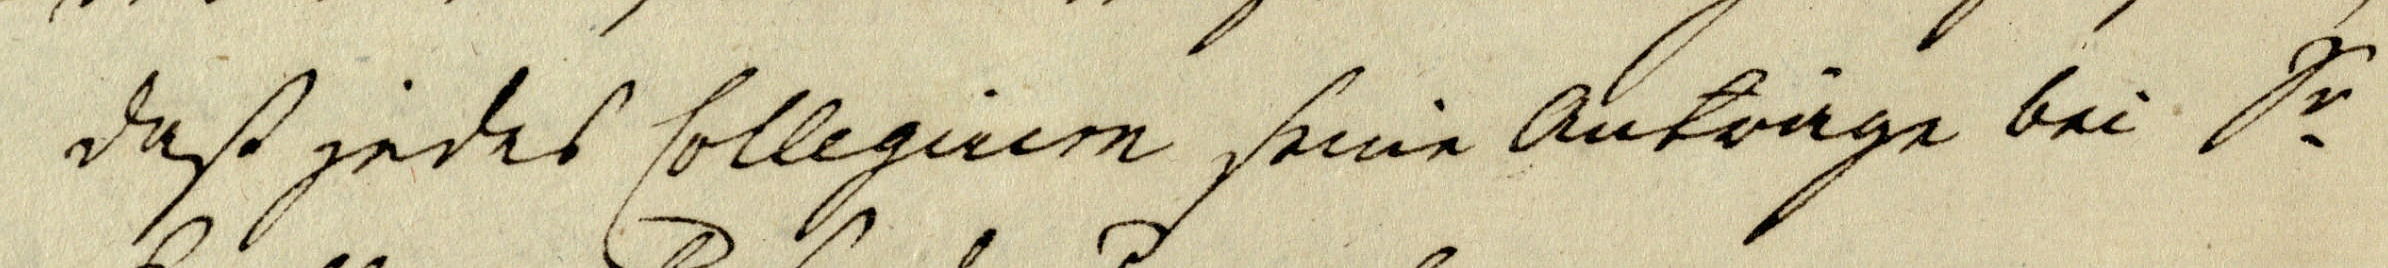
daß jedes Collegium seine Anträge bei Sr
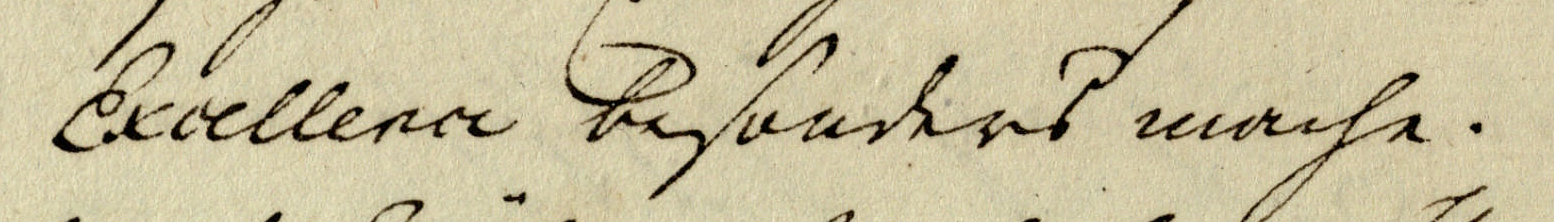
Excellence besonders mache.
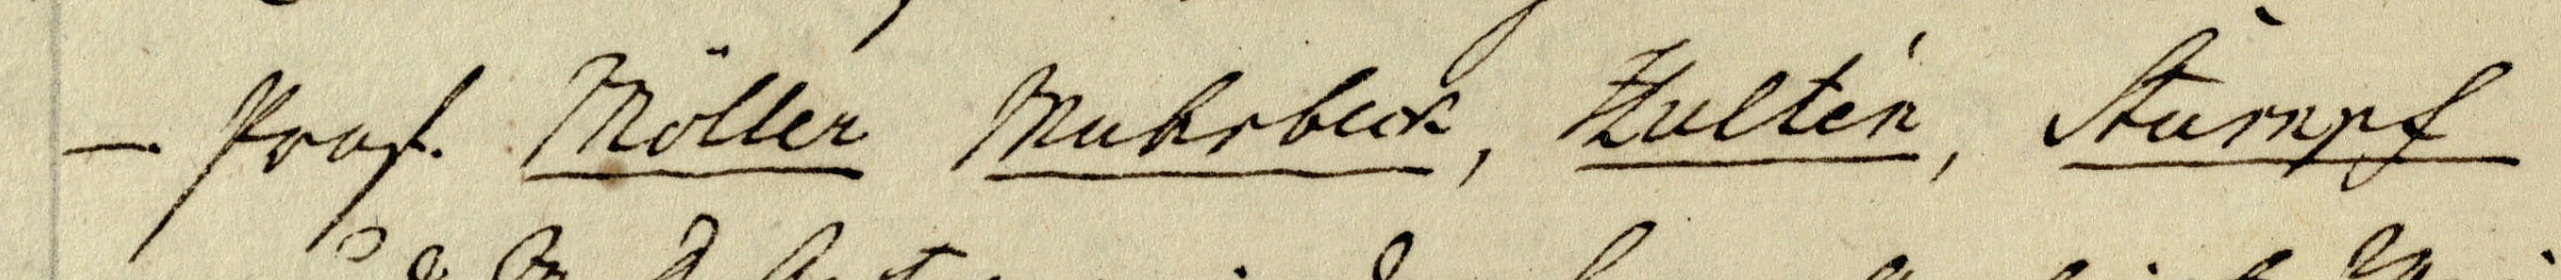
Prof. Möller Muhrbeck, Hultén, Stumpf
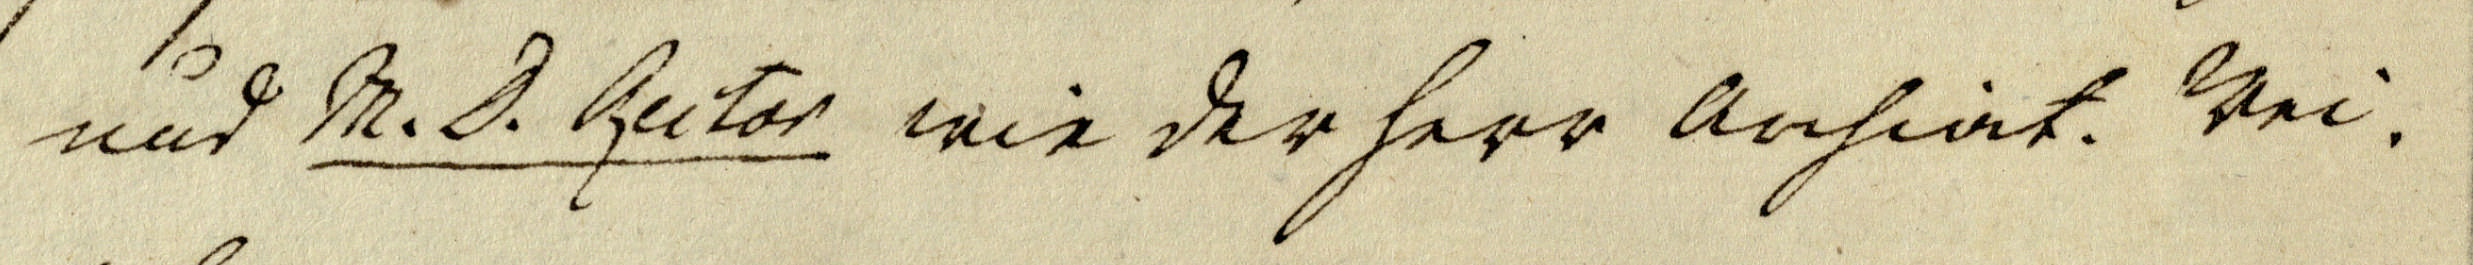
und M. D. Rector wie der Herr Archiat. Wei¬
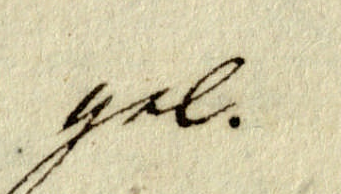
gel.
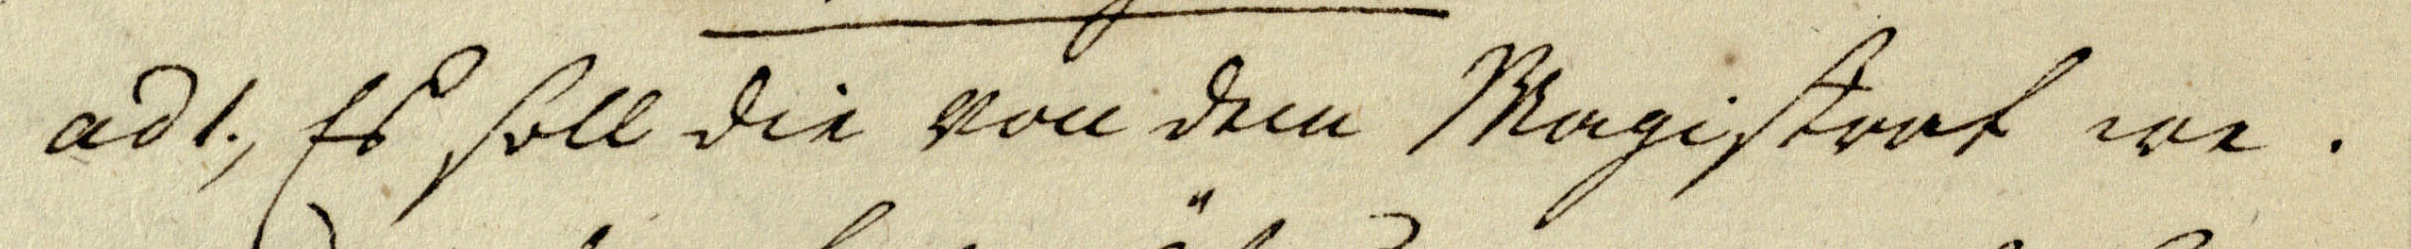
ad 1, Es soll die von dem Magistrat we¬
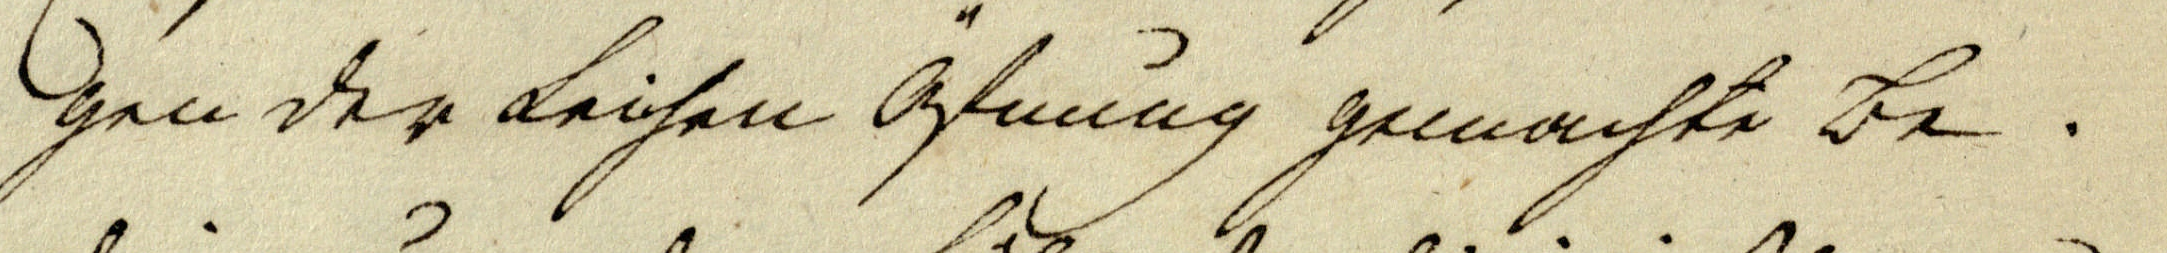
gen der Leichen Öfnung gemachte Be¬
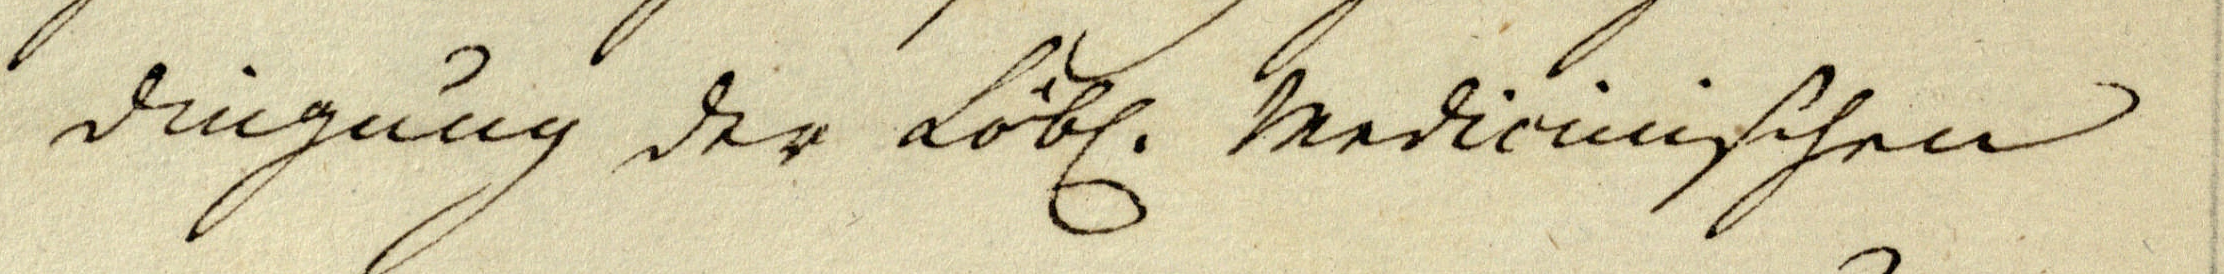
dingung der Löbl. Medicinischen
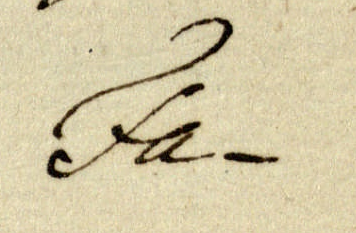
Fa¬
